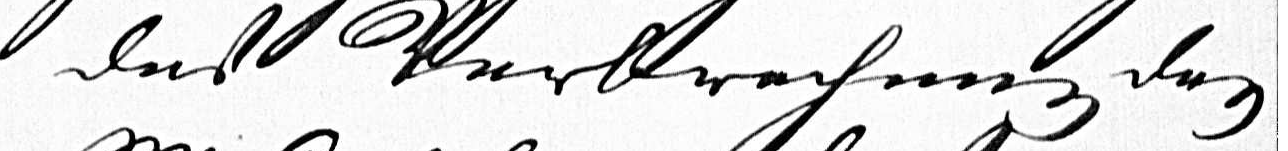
des Verdrechen der
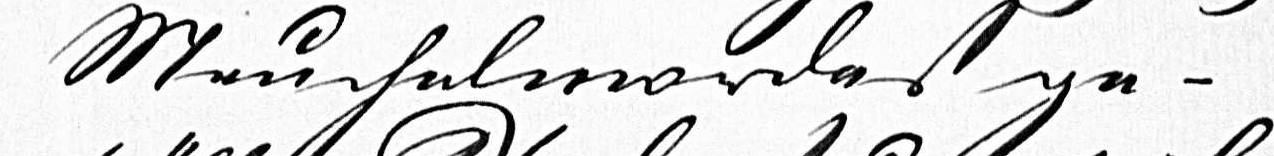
Meuchlmordes ge¬
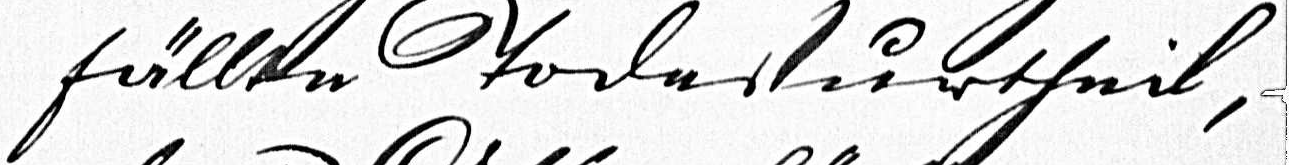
hällte Todesurtheil,
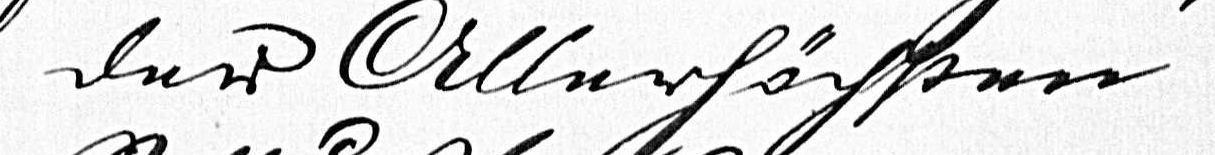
der Allerhöchsten
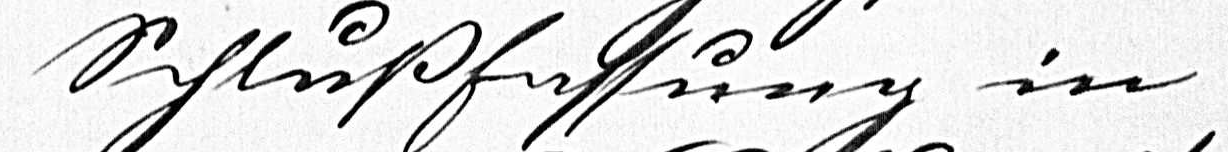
Schlußhassung in
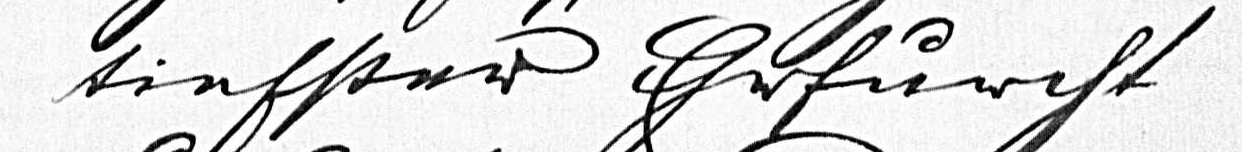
tiefsser Erfurcht
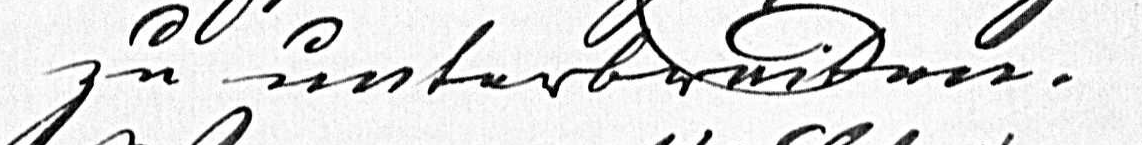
zu unterbruiden.
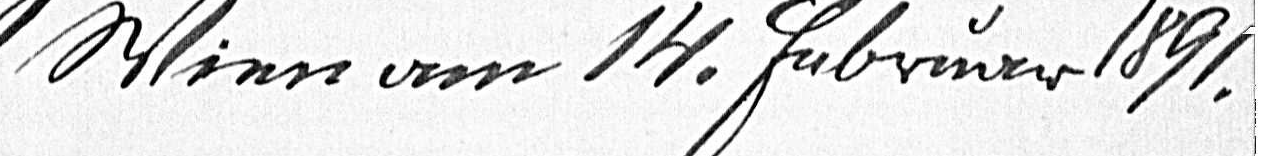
Wien am 14. Fabruar 1891.
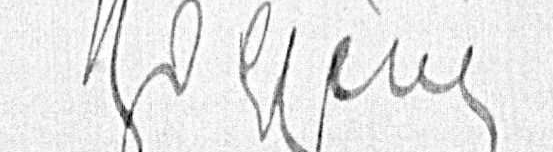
Högeixx
